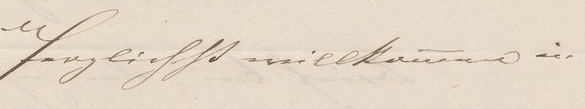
Herzlichst willkommen in
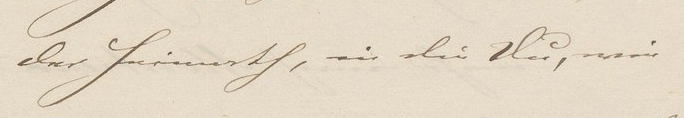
der Heimath, in die Du, wie
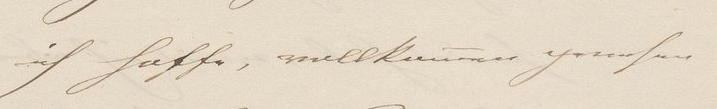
ich hoffe, vollkommen genesen
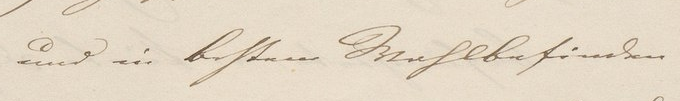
und in besterm Wohlbefinden
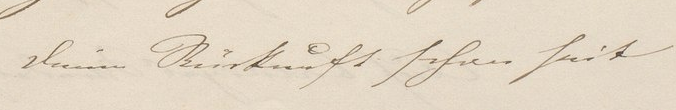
Deine Rückunft schon seit
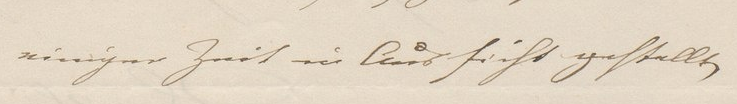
einiger Zeit in Aussicht gestellt
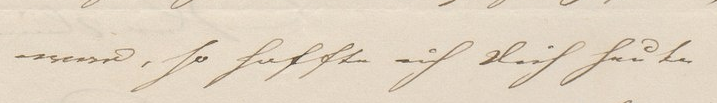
war, so hoffte ich Dich heute
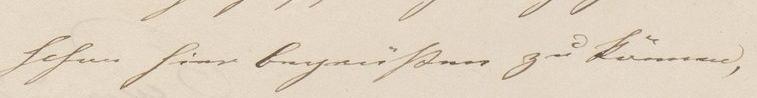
schon hier begrüßen zu können,
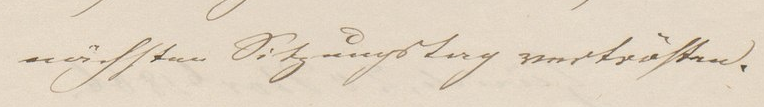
nächsten Sitzungstag vertrösten.
